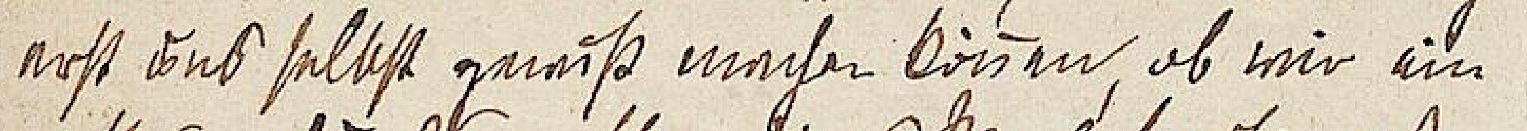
erst uns selbst gewiß machen könen, ob wir ein
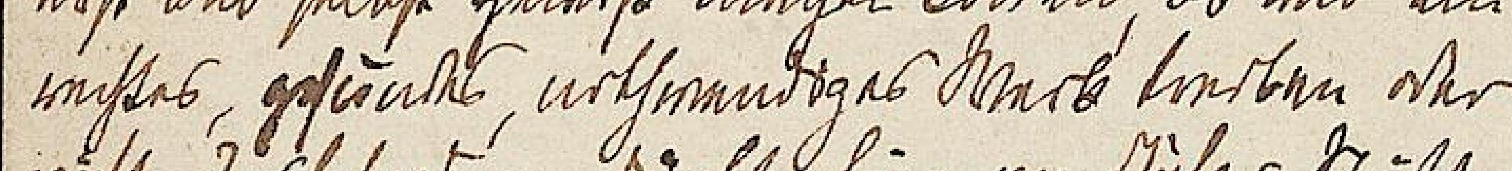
rechtes, gesundes, nothwendiges Werk treiben oder
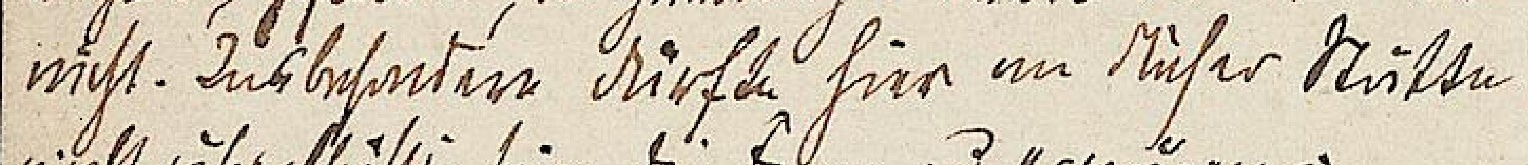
nicht. Insbesondere dürfte hier an dieser Stätte
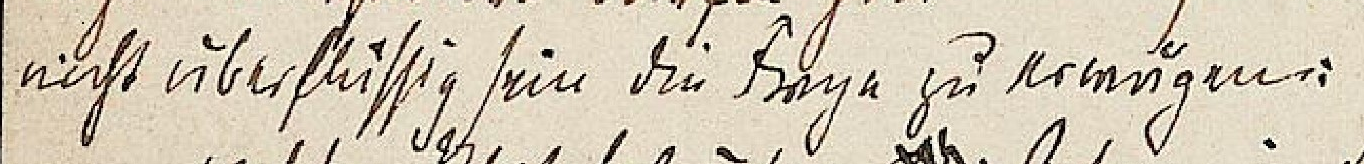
nicht überflüssig sein die Frage zu erwägen:
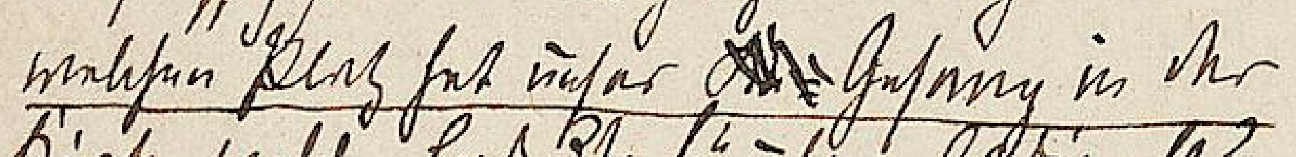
welchen Platz hat unser Kn- Gesang in der
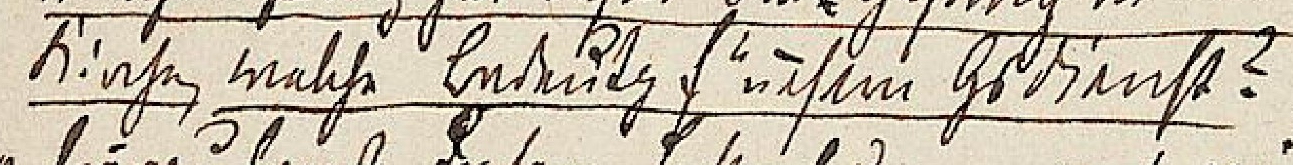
Kirche, welche Bedeutg fü unsern Gsdienst?
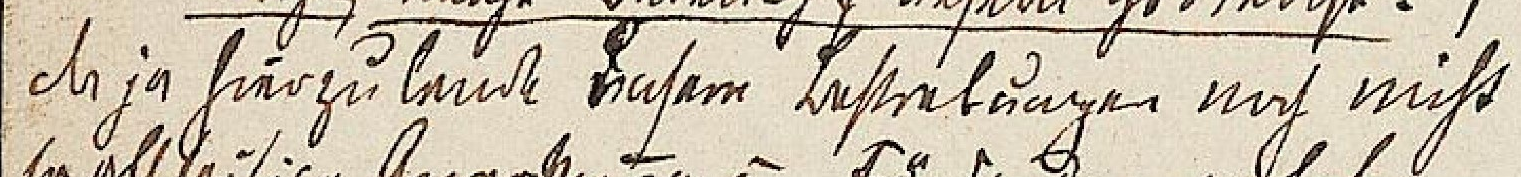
da ja hierzulande unsere Bestrebungen noch nicht
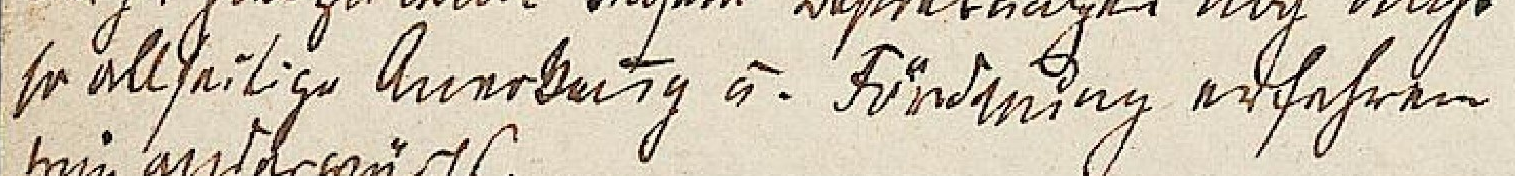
so allseitige Anerkeng u. Förderung erfahren
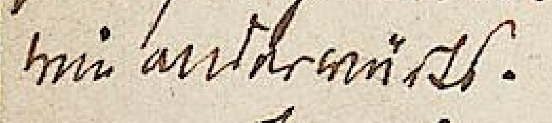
wie anderwärts..
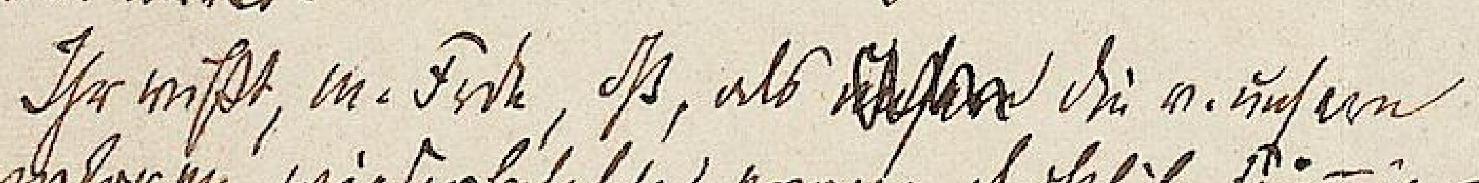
In wißt, m. Frde, daß, als unsere die v. unsern
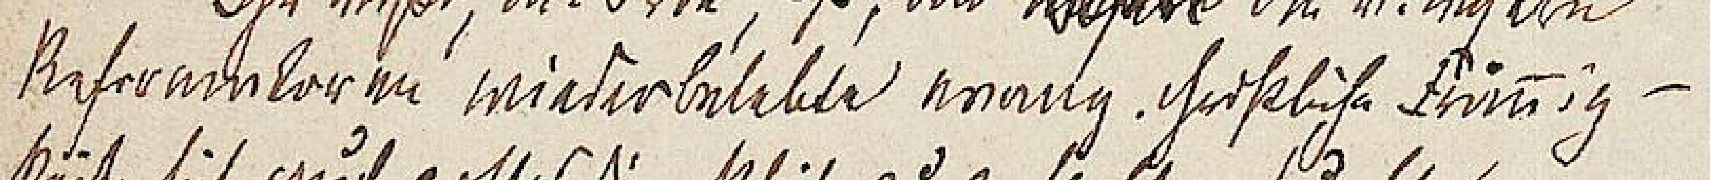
Reformatoren wiederbelebte evang. christliche Frömig¬
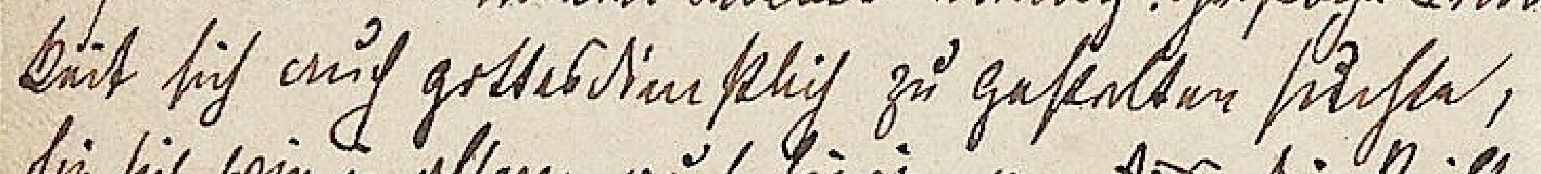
keit sich auch gottesdienstlich zu gestalten suchte,
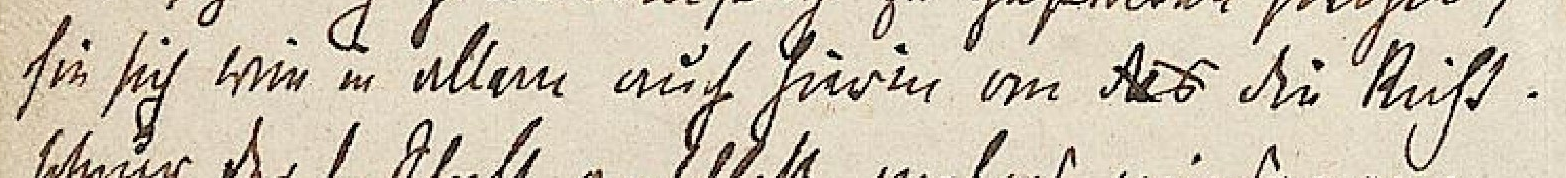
sie sich wie in allem auch hierin an das die Richt¬
